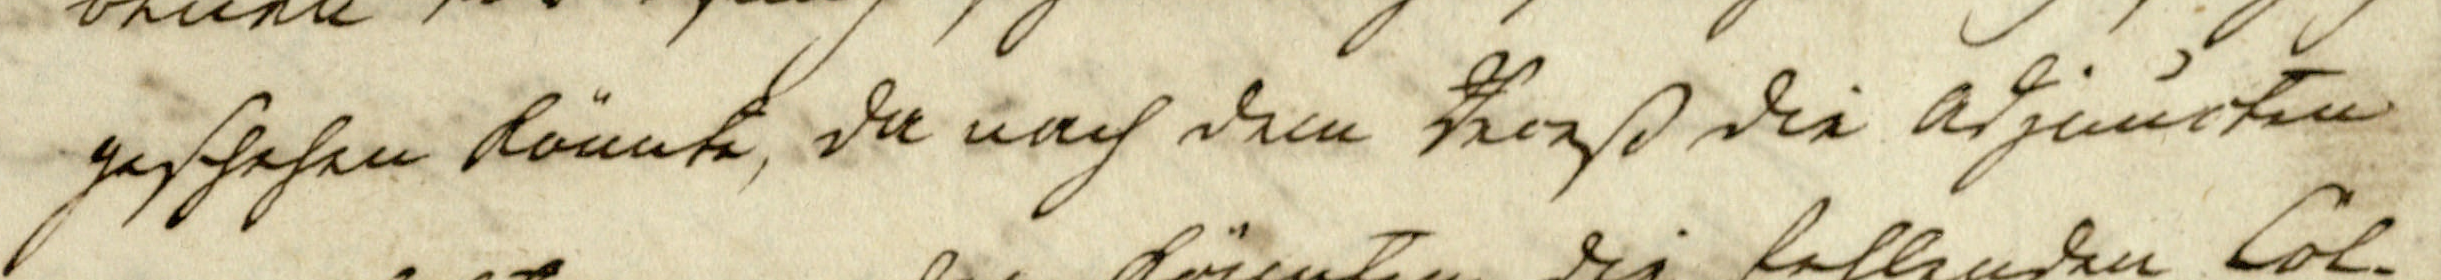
geschehen könnte, da nach dem Receß die Adjuncten
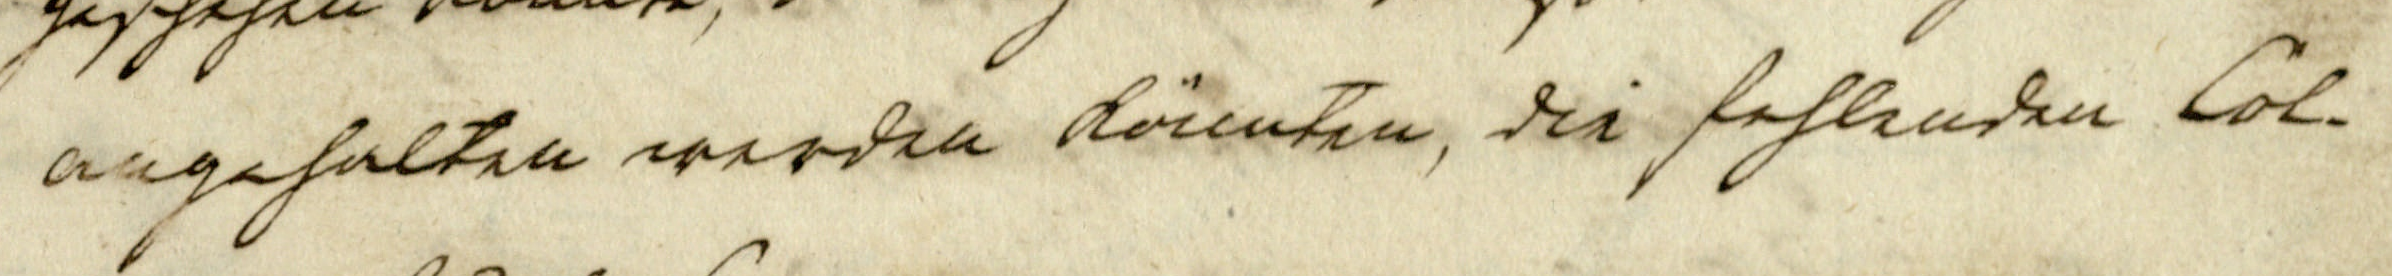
angehalten werden könnten, die fehlenden Col¬
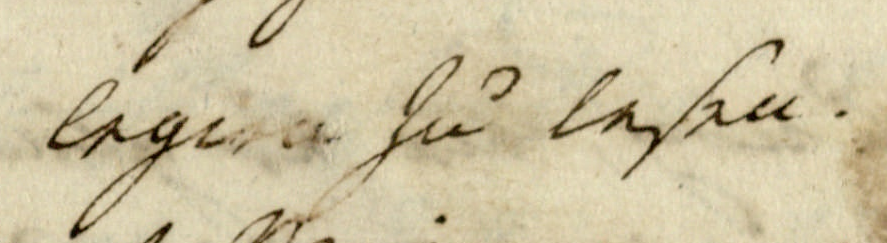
legien zu lesen.
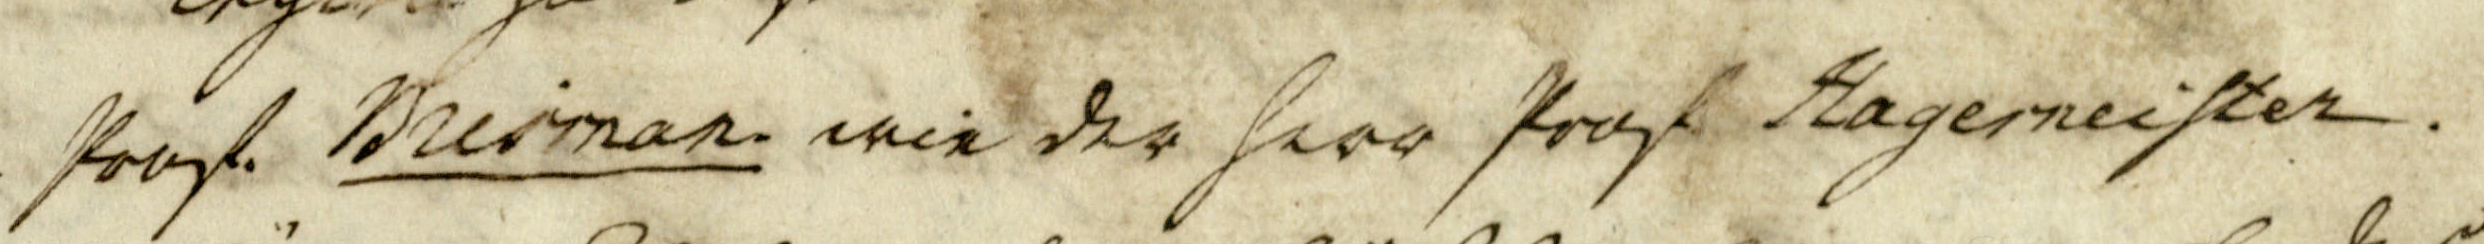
Prof. Brisman wie der herr Prof. Hagemeister.
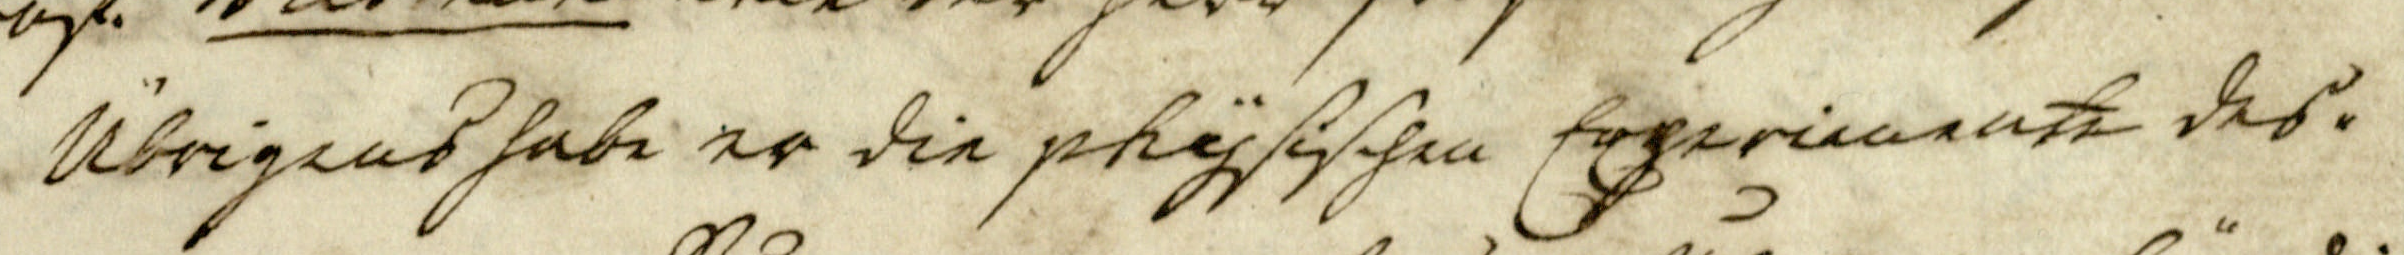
Übrigens habe er die phÿsischen Experimente des¬
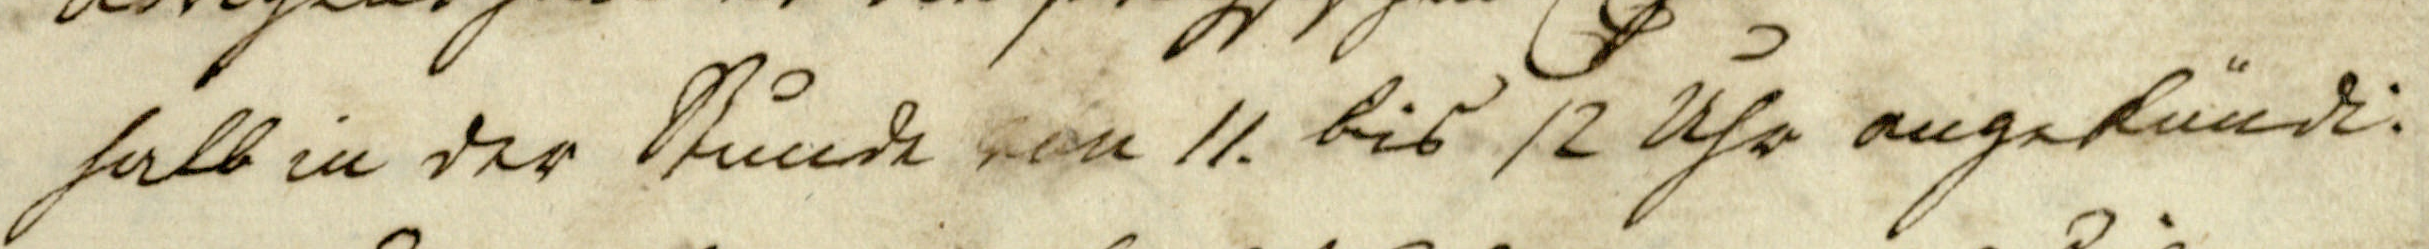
halb in der Stunde von 11. bis 12 Uhr angekündi¬
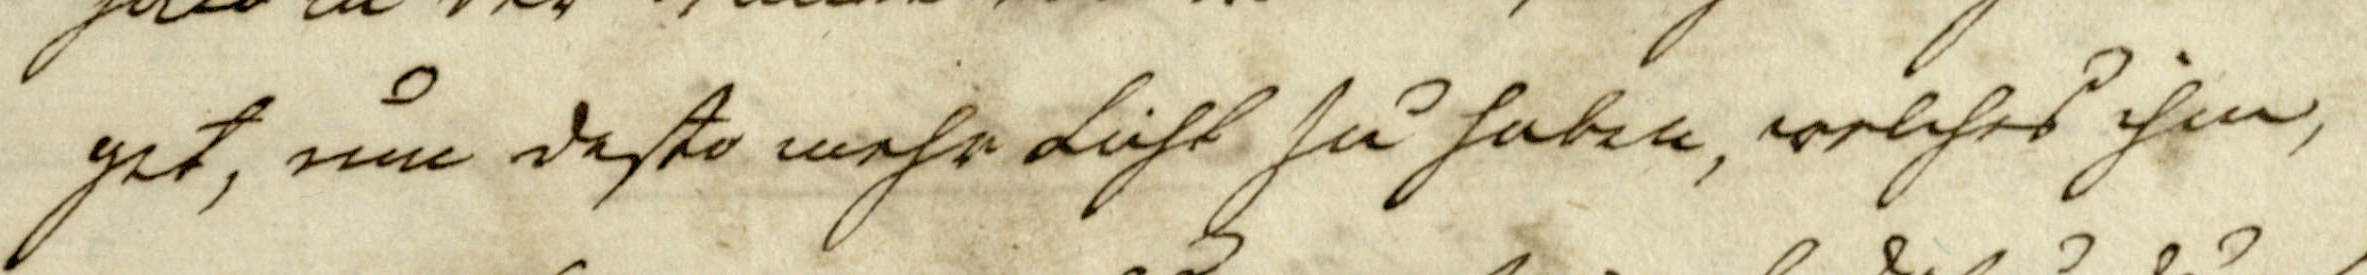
get, um desto mehr Licht zu haben, welches ihm,
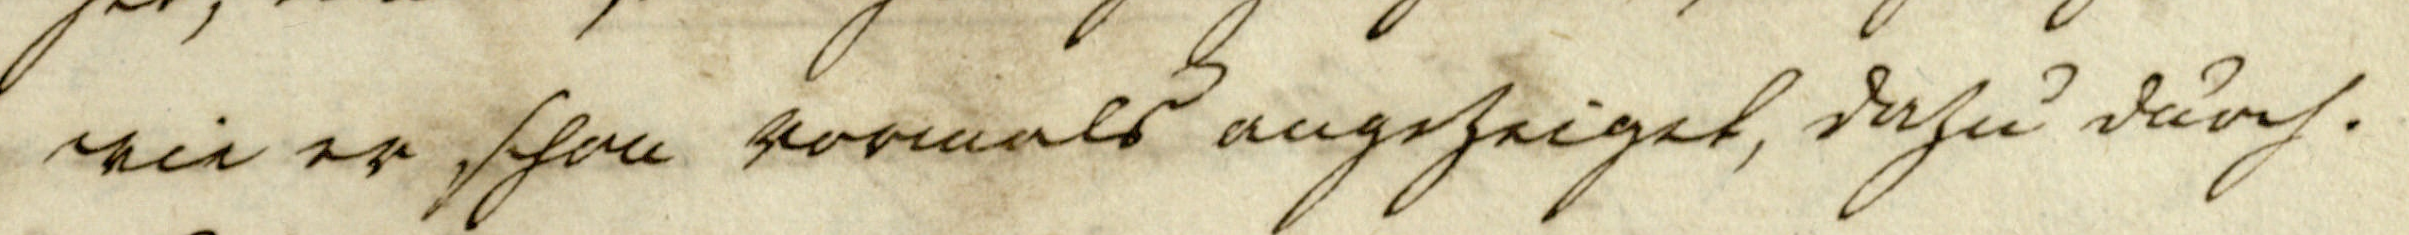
wie er schon vormals angezeiget, dazu durch¬
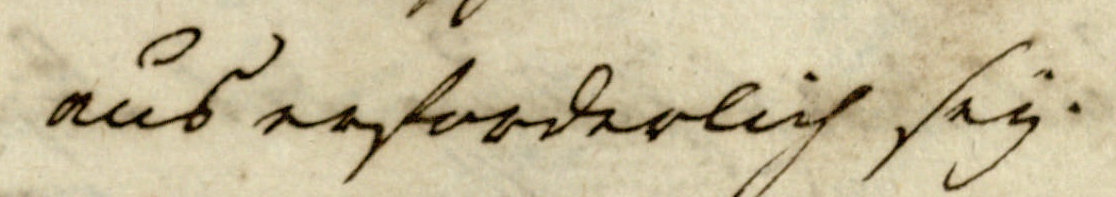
aus erforderlich seÿ.
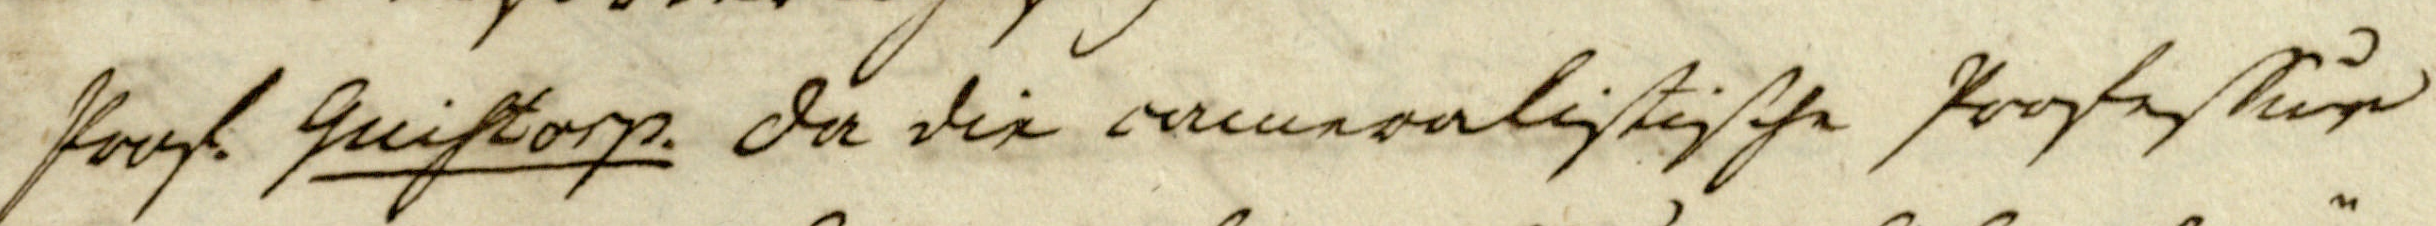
Prof. Quistorp. Da die cameralistische Professur
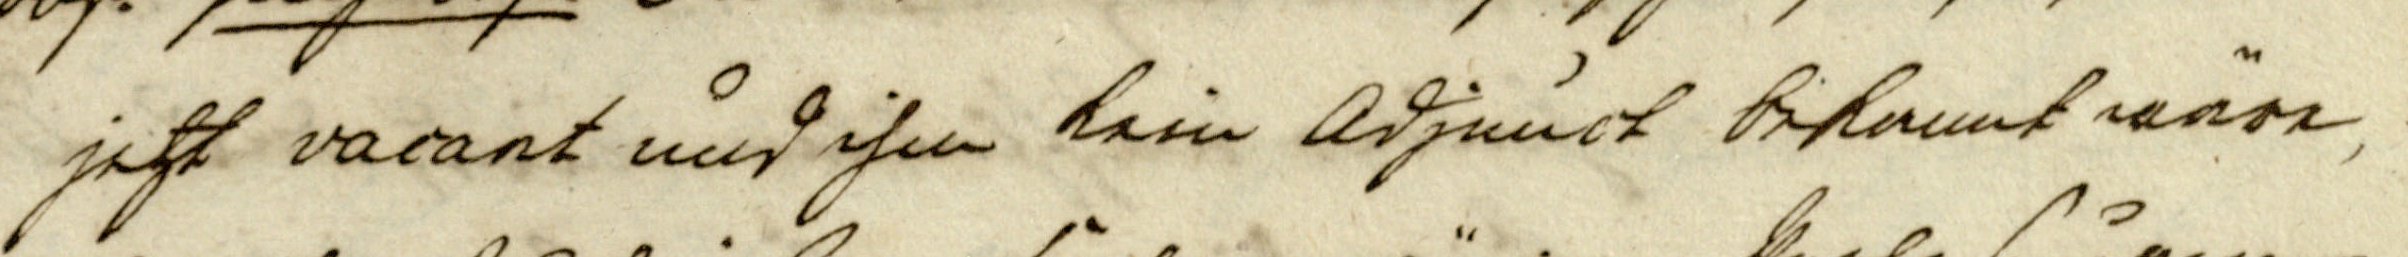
jetzt vacant und ihm kein Adjunct bekannt wäre,
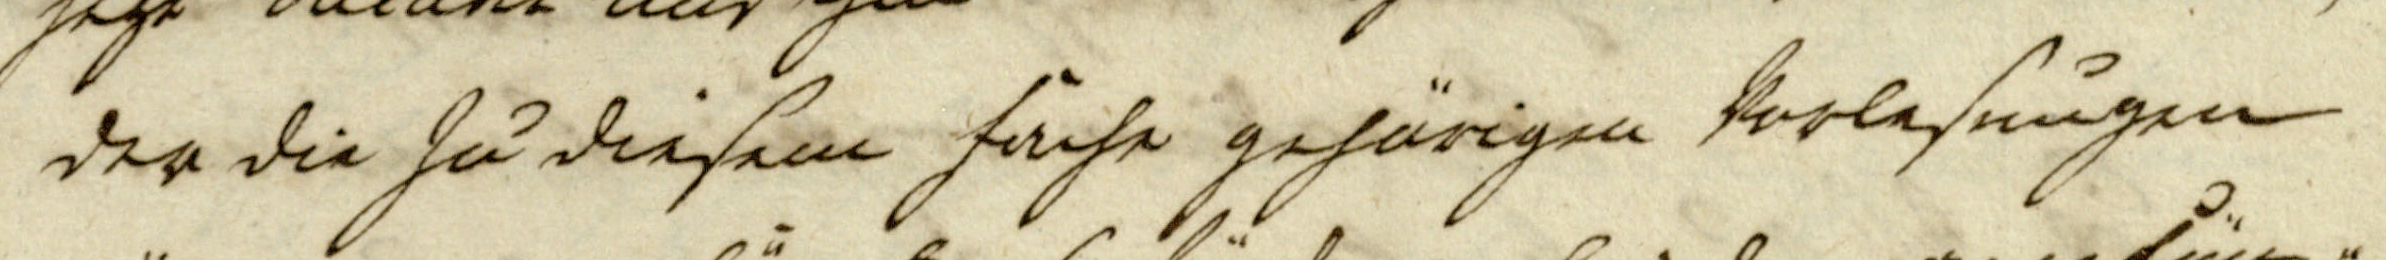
der die zu diesem Fache gehörigen Vorlesungen
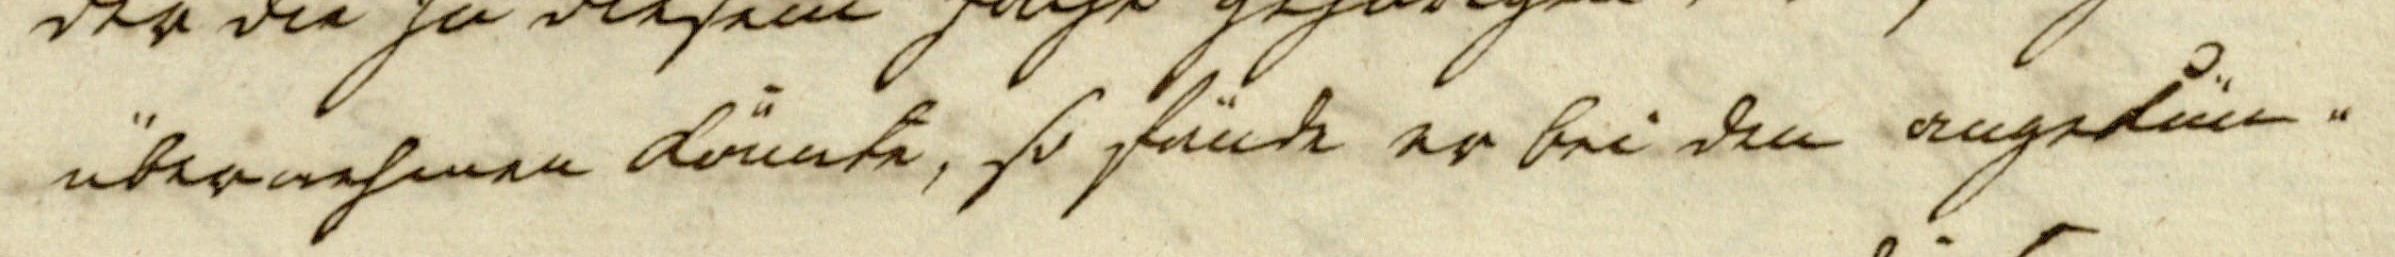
übernehmen könnte, so fände er bei den angekün¬
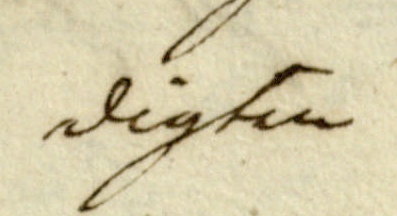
digten
